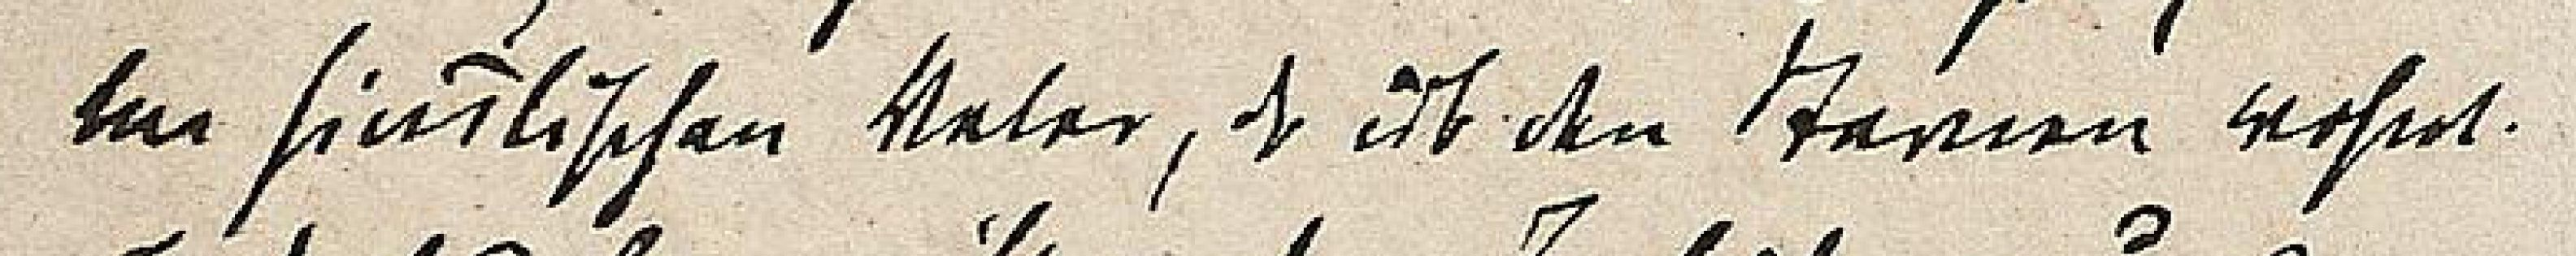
1m himlischen Vater, dr ün den Sternen wohnt.
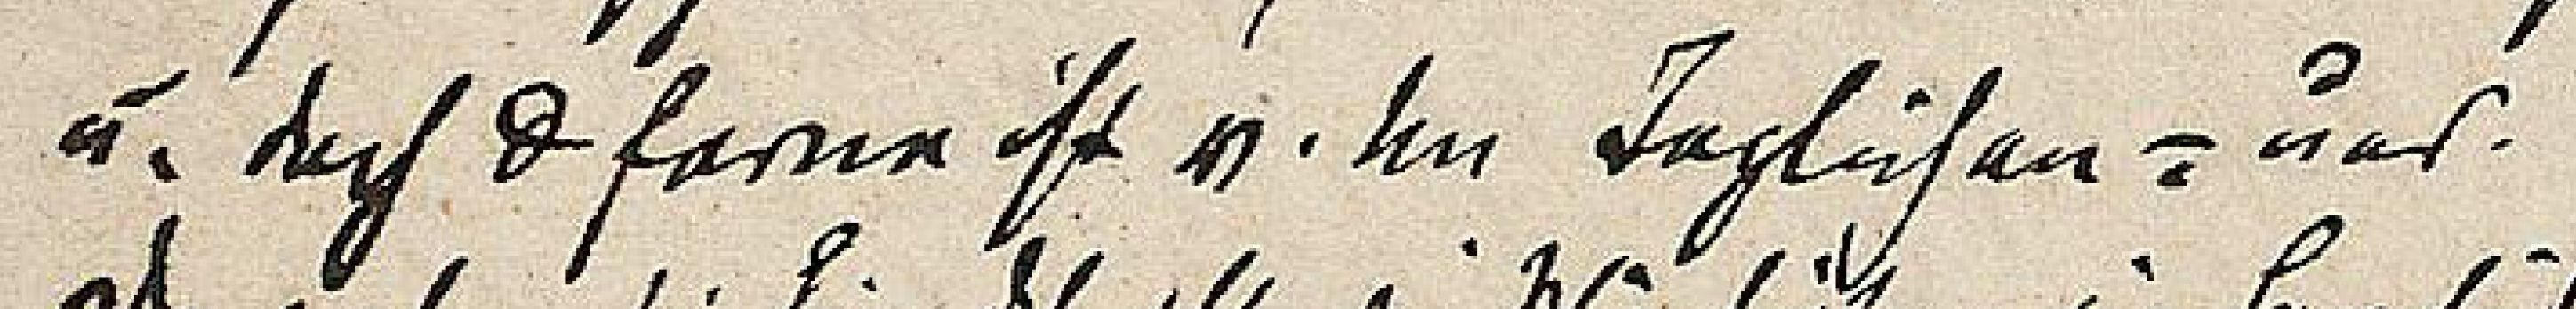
u doch o ferne ferne ist v. 1m Jeglichen- uns.
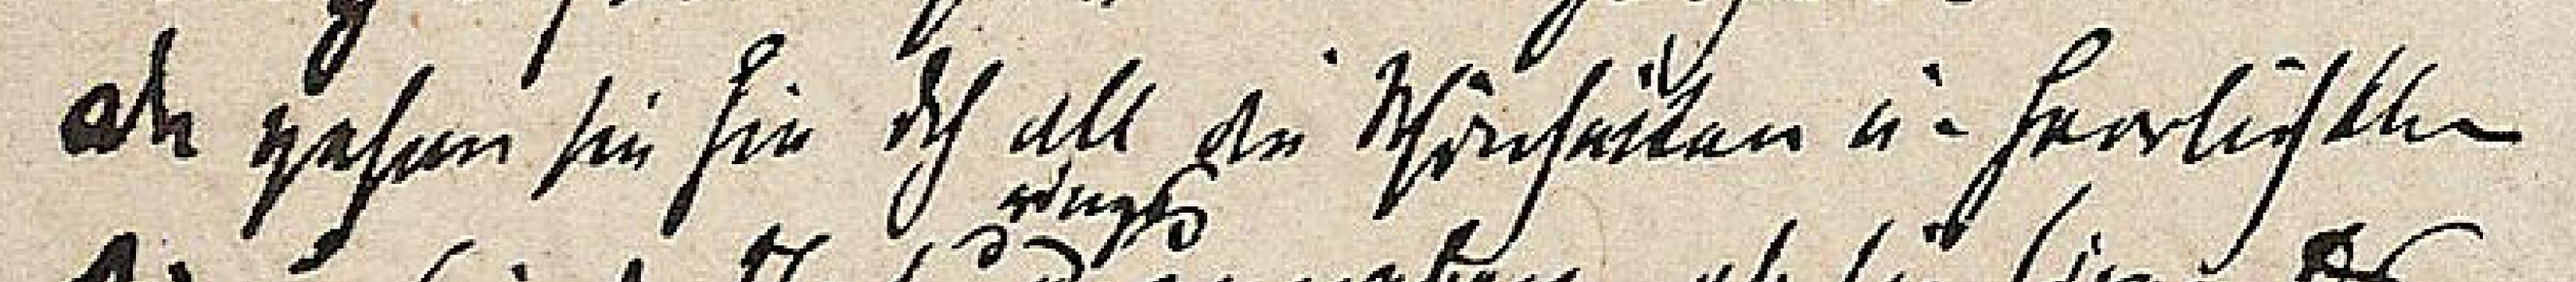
Da gehen sie hin dch all die Schönheiten u. Herrlichtktn
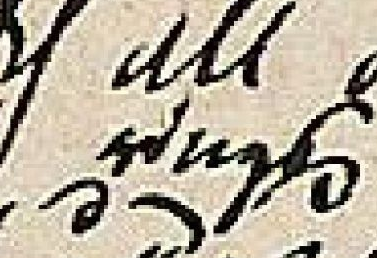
rings
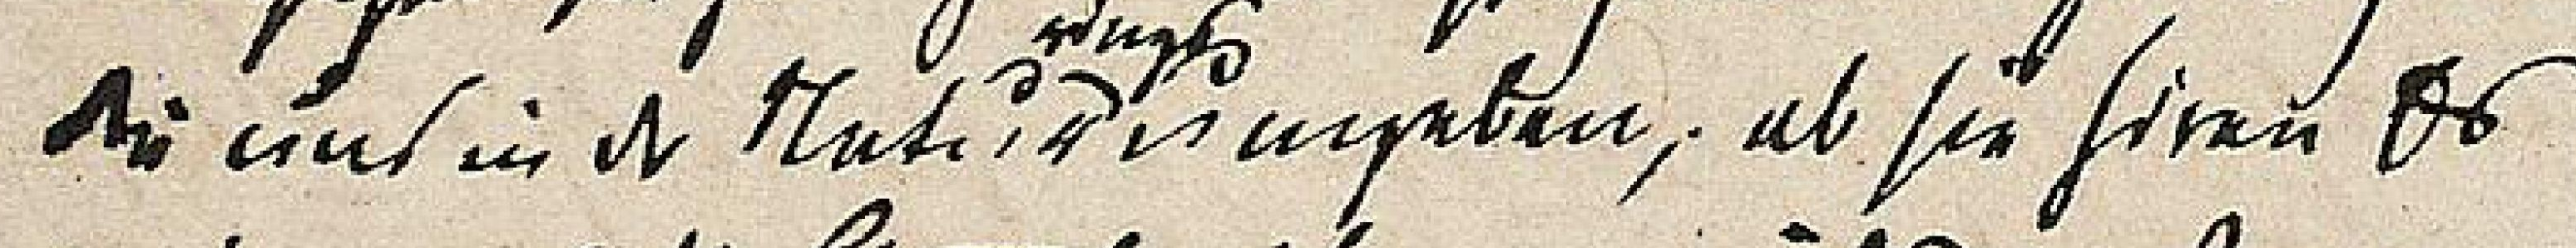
die uns in der Natur umgeben, ab sie hören os
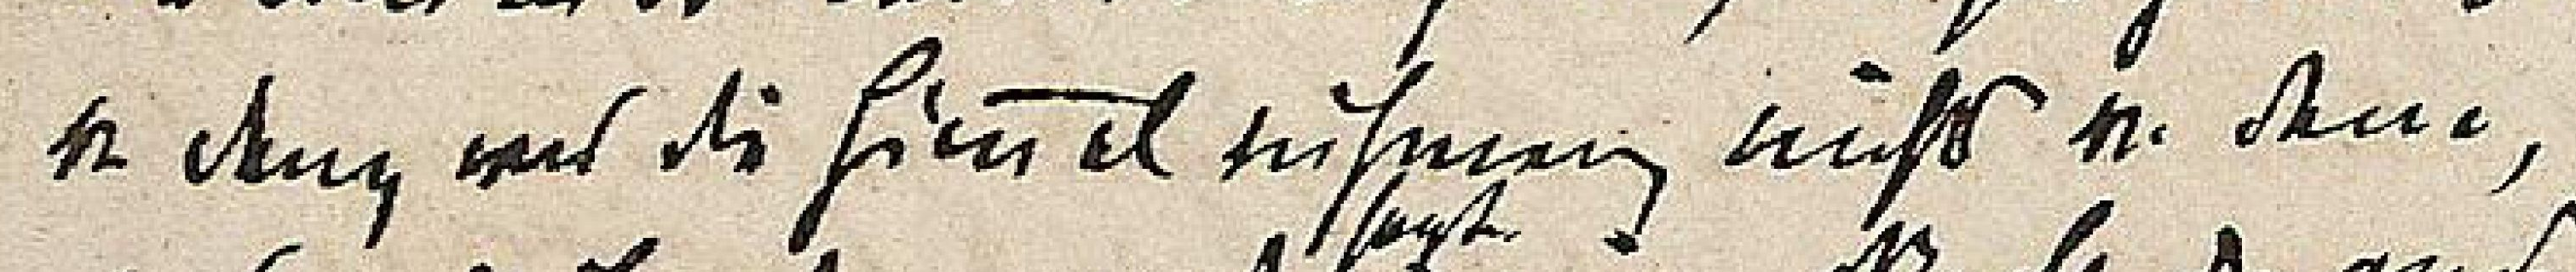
v. dem, was die Himel rühren, nichts v dem,
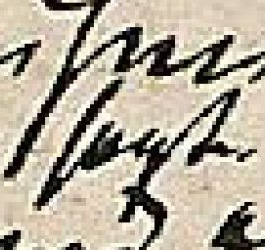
sagt
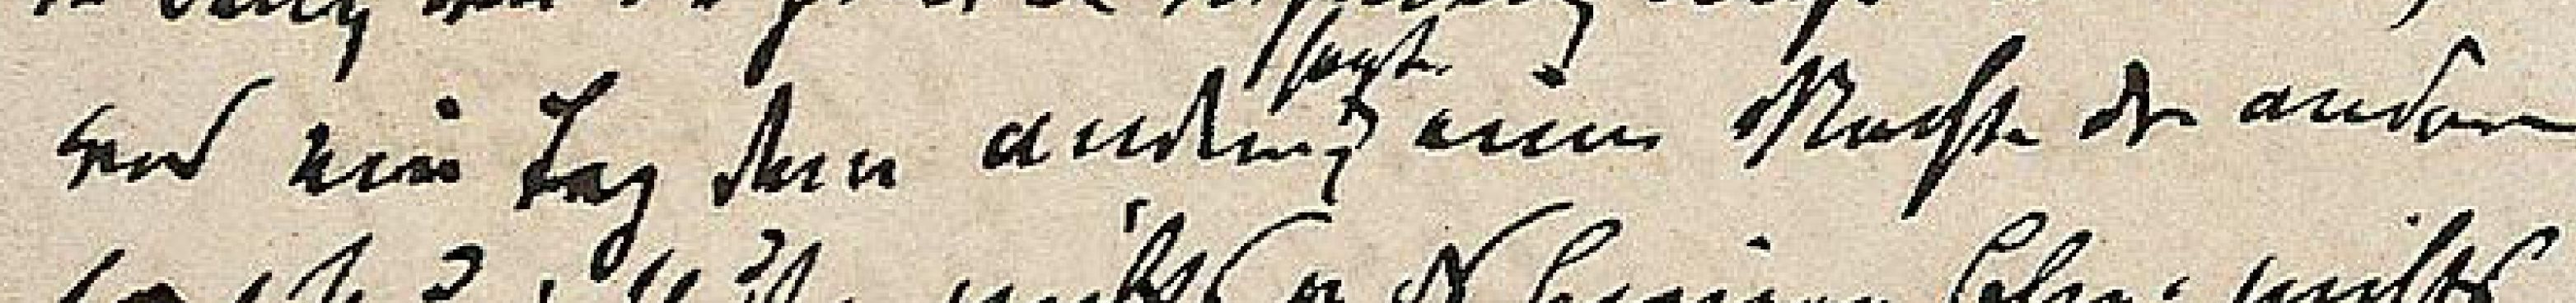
was ein Tag dem andern; eine Nacht dr andern
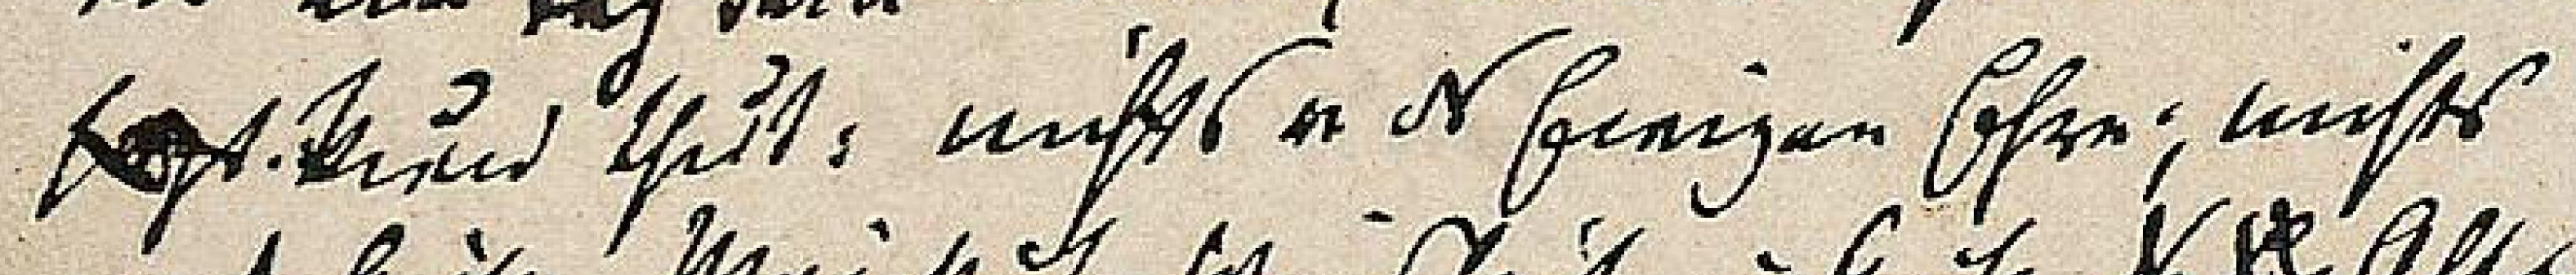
sagt kund thut: nichts v. ds Ewigen Ehre, nichts
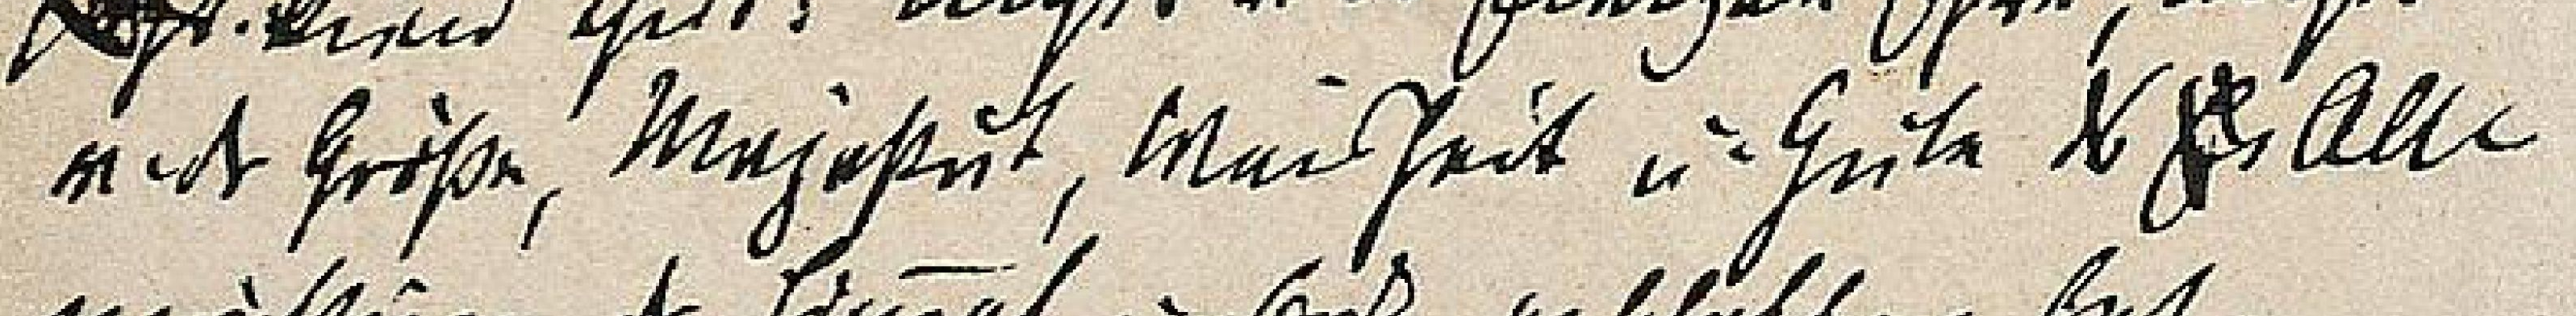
v. dr. Größe, Majestät, Weisheist u. Güte ds. Er All¬
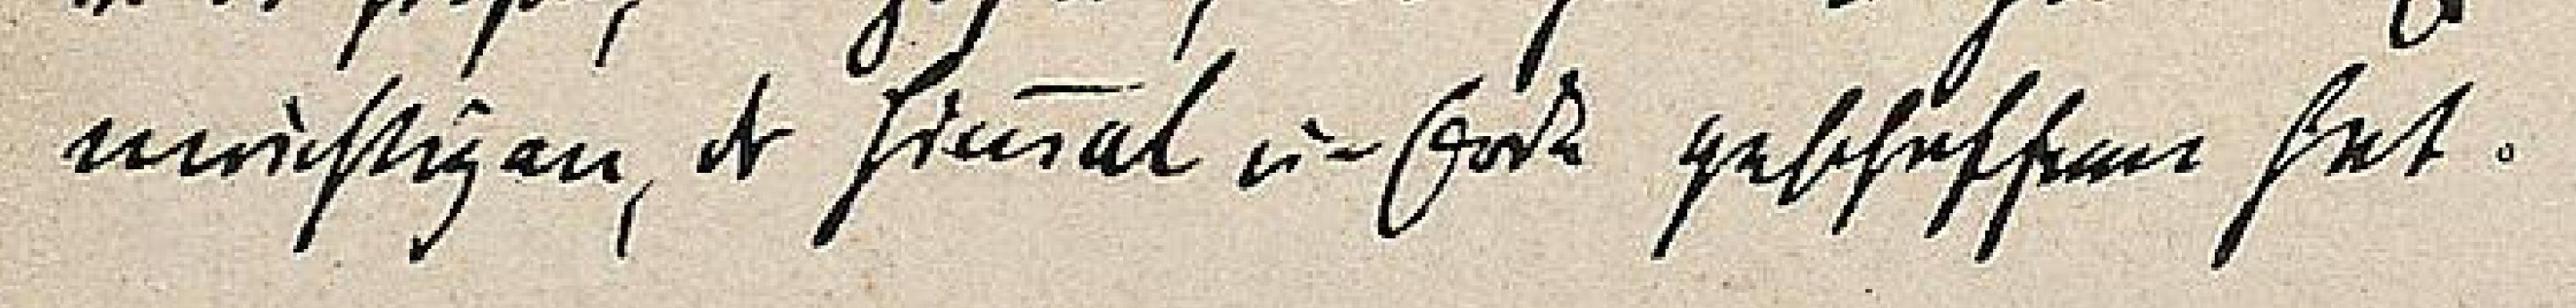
mächtigen, dr Himmel u. Erde gescheffnen hat.
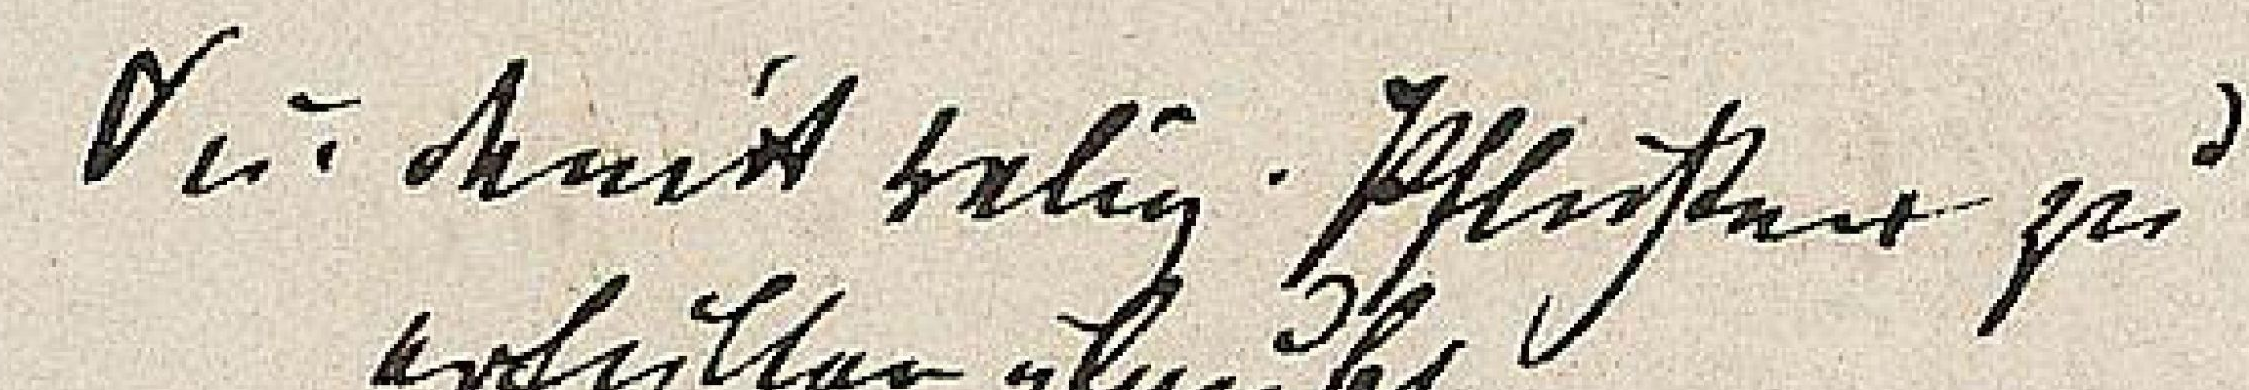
V u. damit relig. Pflichten zu
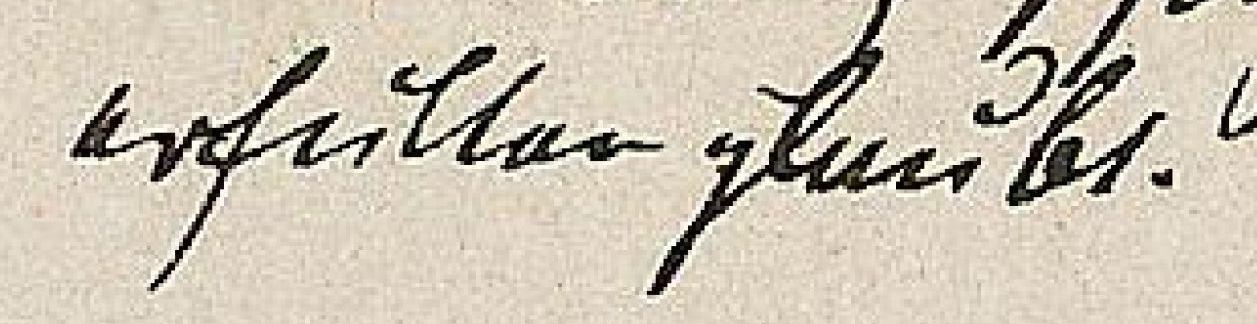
erfüllen glaubt.
